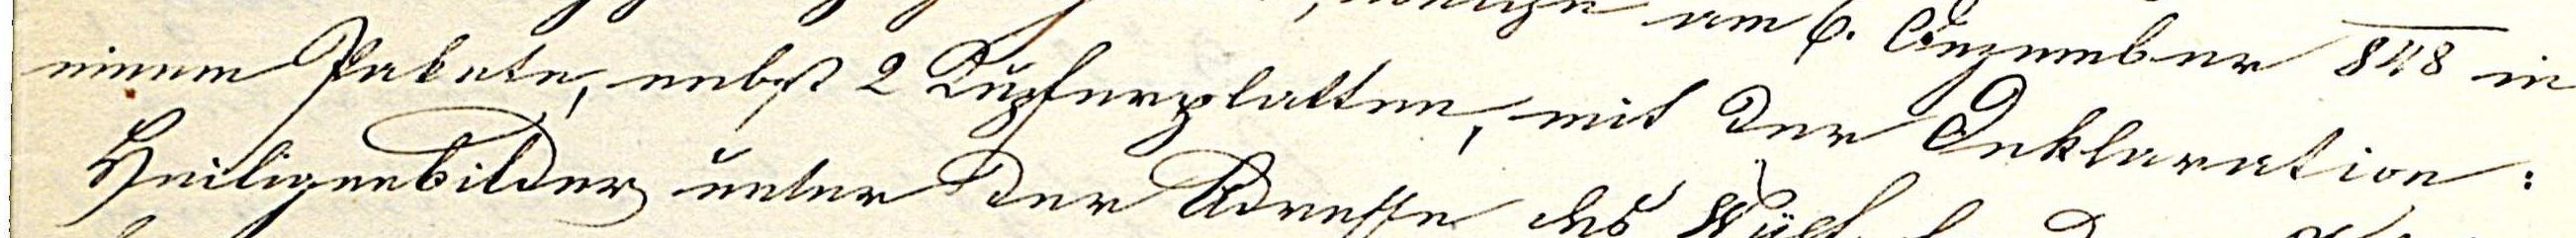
einem Pakete, nebst 2 Kupferplatten, mit der Deklaration:
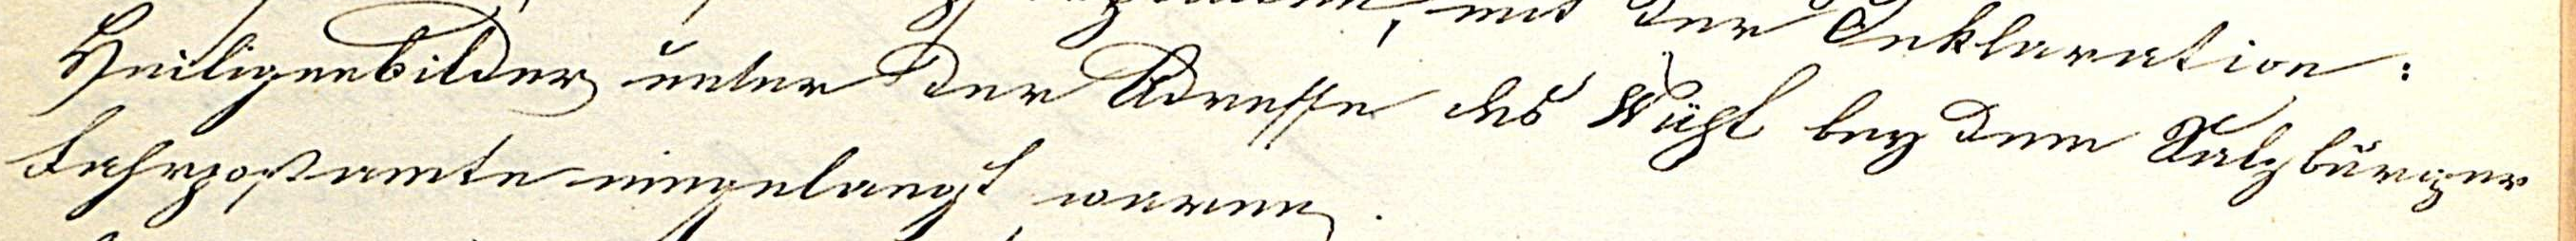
Heiligenbilder unter der Adresse des Wüst bey dem Salzburger
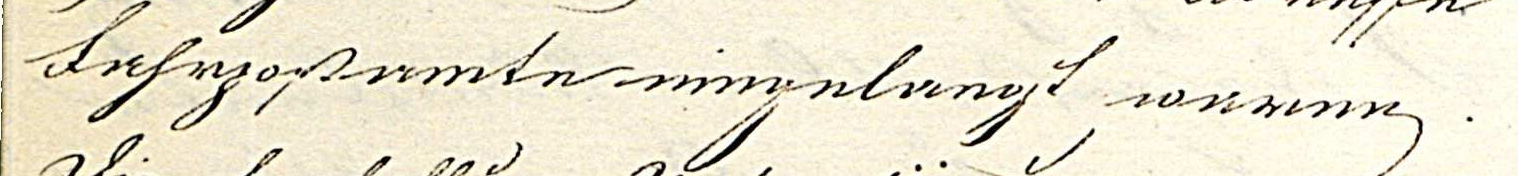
Fahrpostamte eingelangt waren.
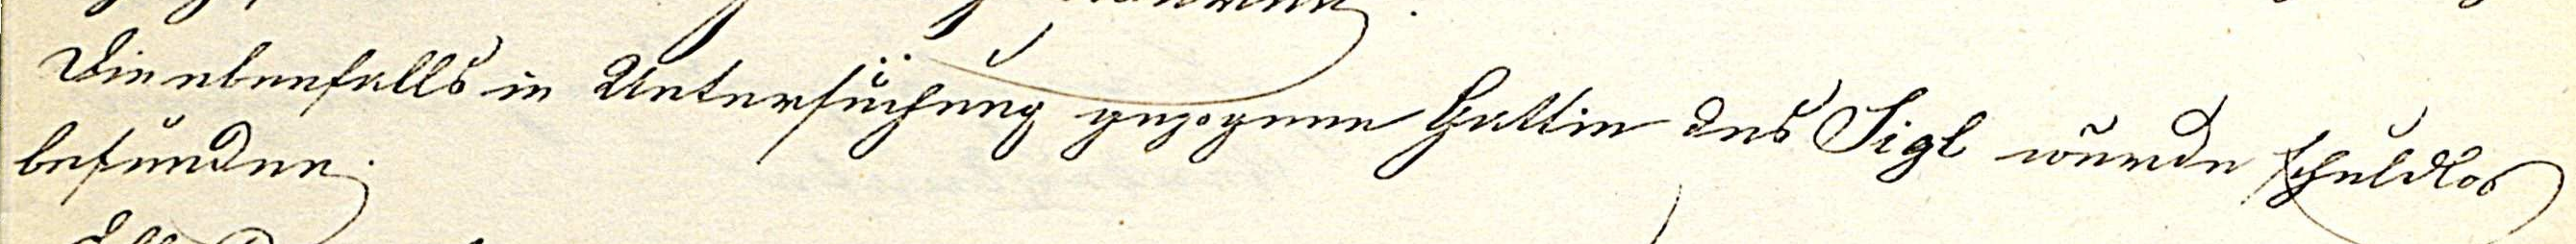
Die ebenfalls in Untersuchung gezogene Gattin des Sigl wurde schuldlos
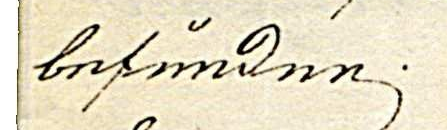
befunden.
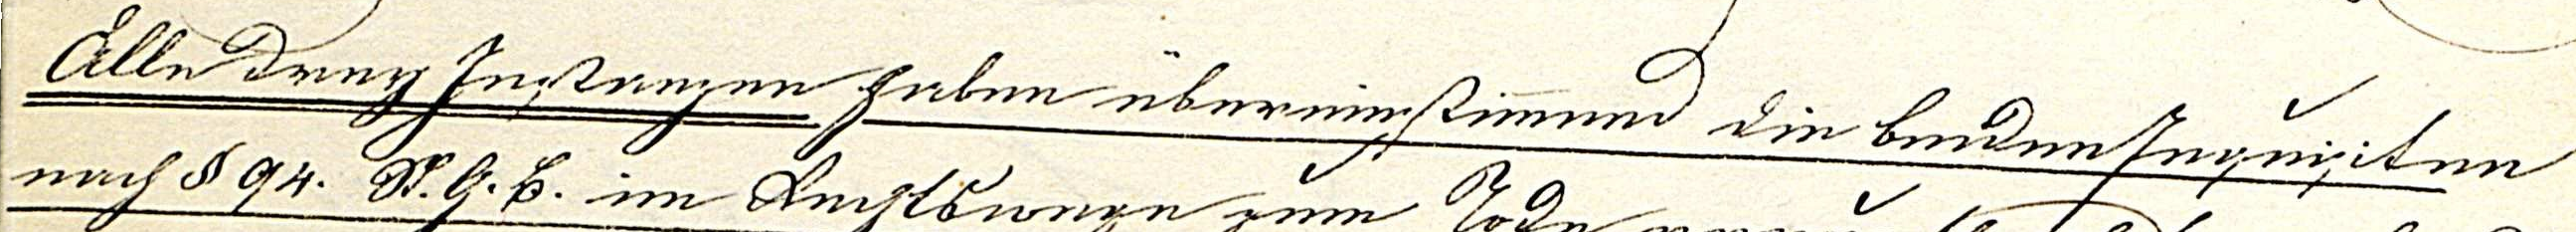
Alle drey Instanzen haben übereinstimmend die beiden Inquisiten
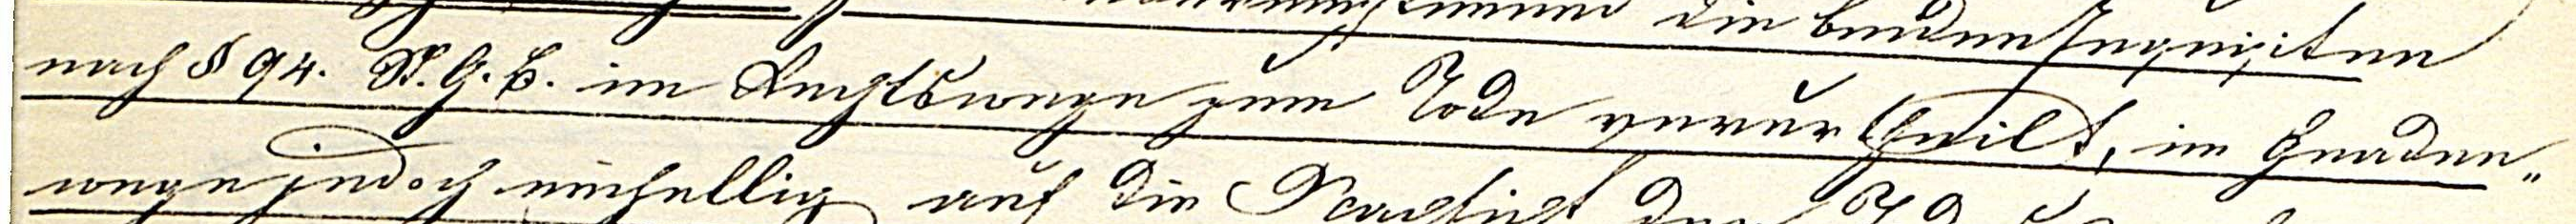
nach §94 StGB im Rechtswege zum Tode verurtheilt, im Gnaden¬
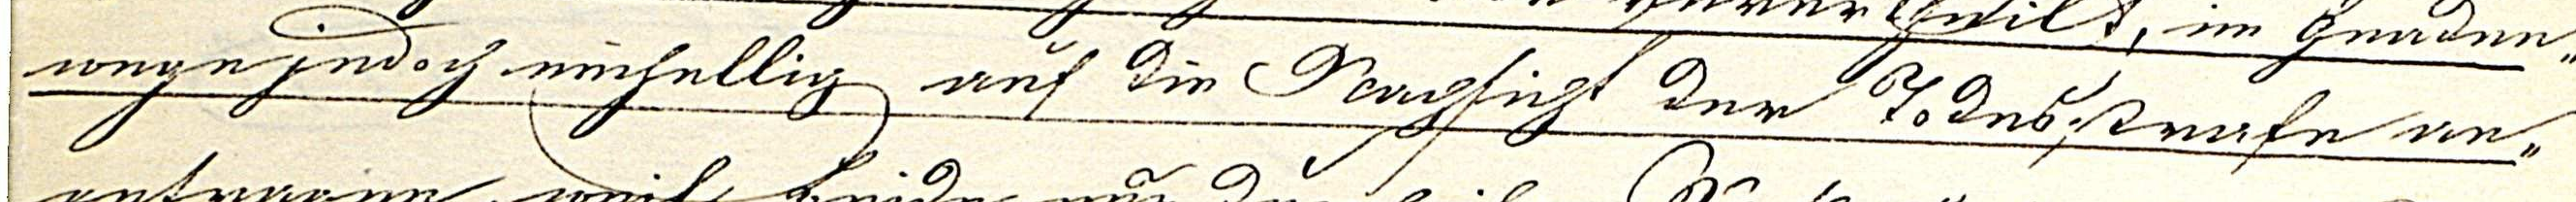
wege jedoch einhellig auf die Nachsicht der Todesstrafe an¬
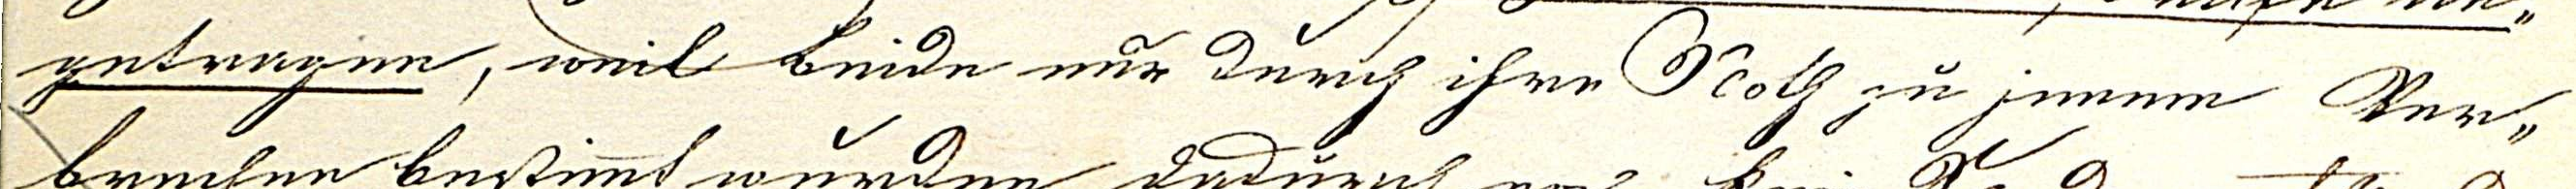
getragen, weil Beide nur durch ihre Noth zu jenem Ver¬
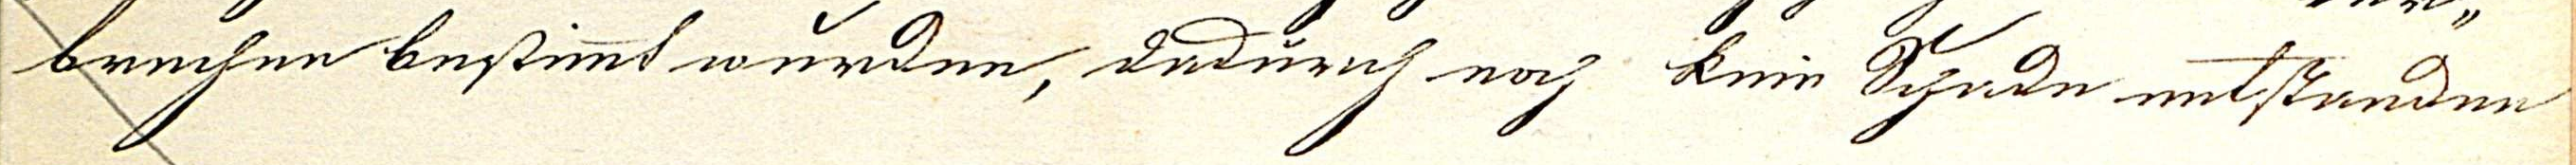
brechen bestimmt wurden, dadurch noch kein Schade entstanden
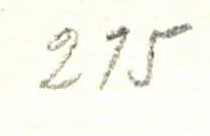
275
